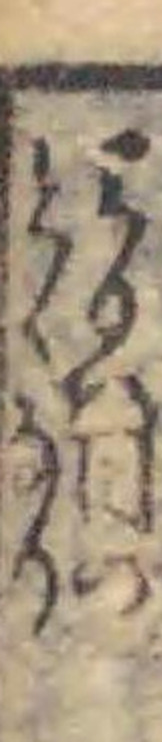とくなり
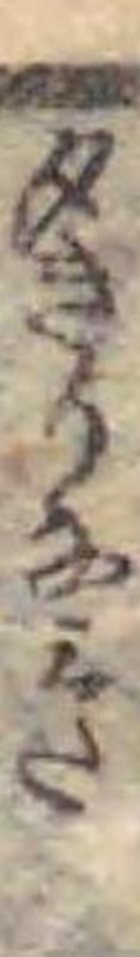夕きりなみた
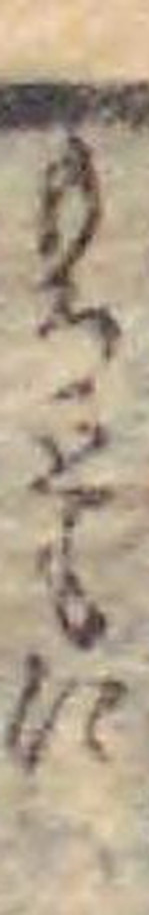もろともに
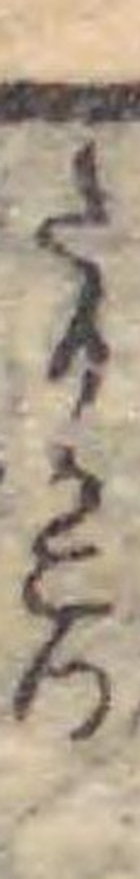たりかこつ
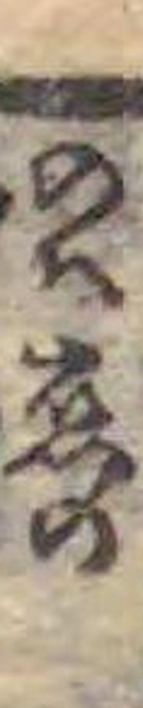のは恋の
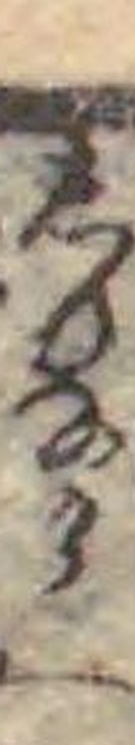しりなから
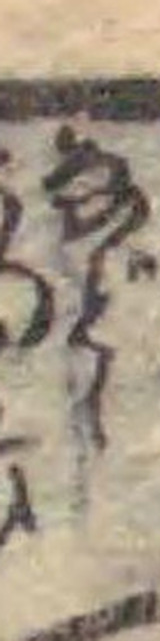などゝ
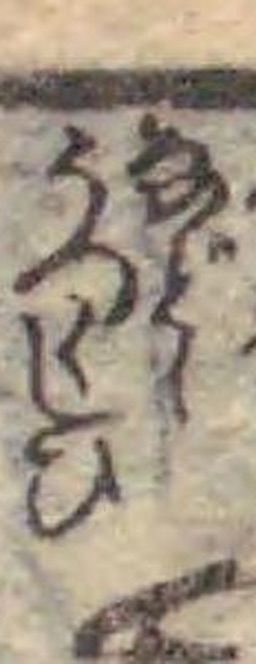うつくしひ
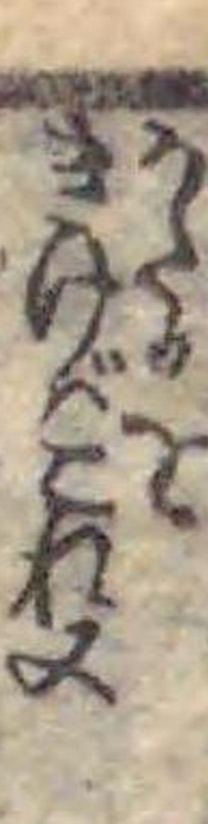きけばこれ又
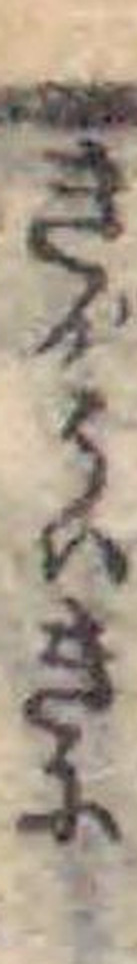きがうはきに
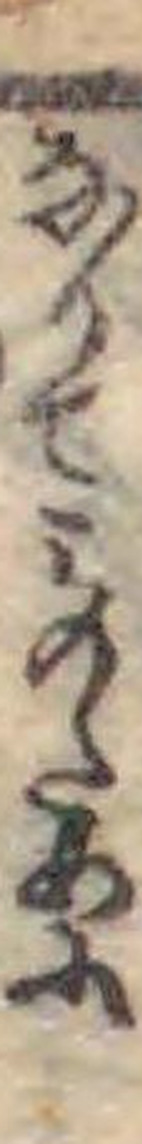なりてみのために
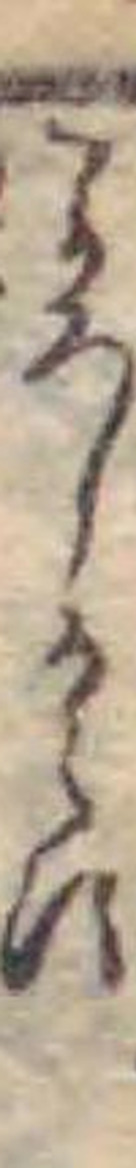よろしからす
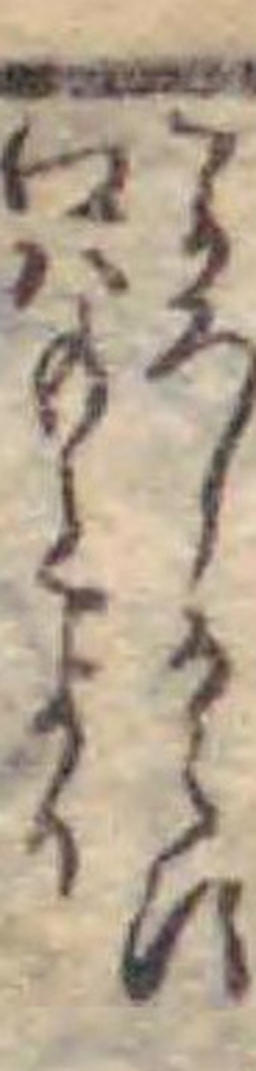口はもとより
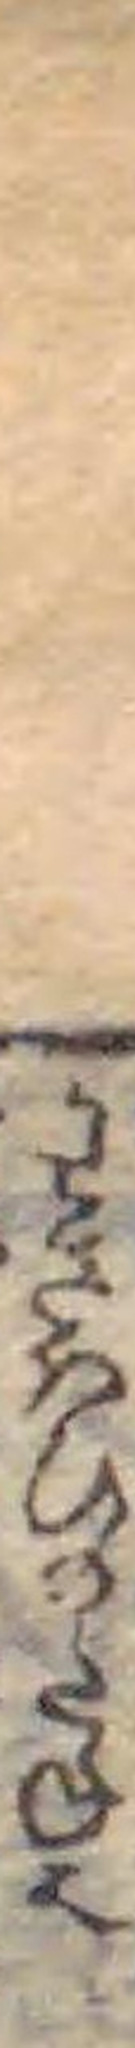わさはひのたね也
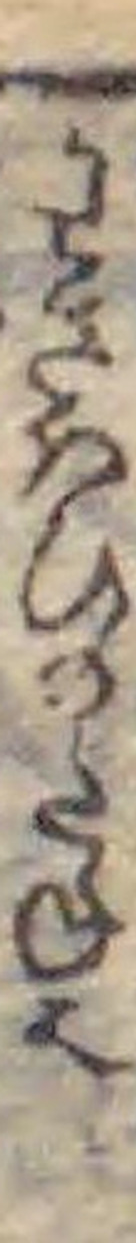わさはひのたね也
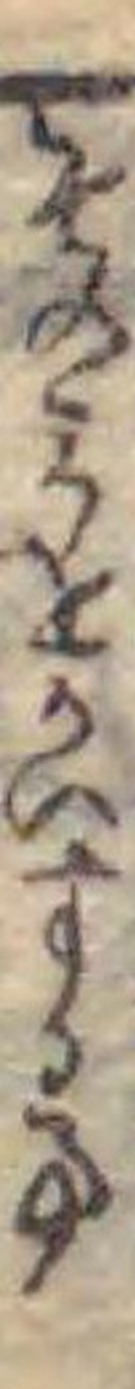そのみをかいする事
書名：身体開帳略縁起 : 3巻
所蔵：国立国会図書館 National Diet Library, JAPAN
